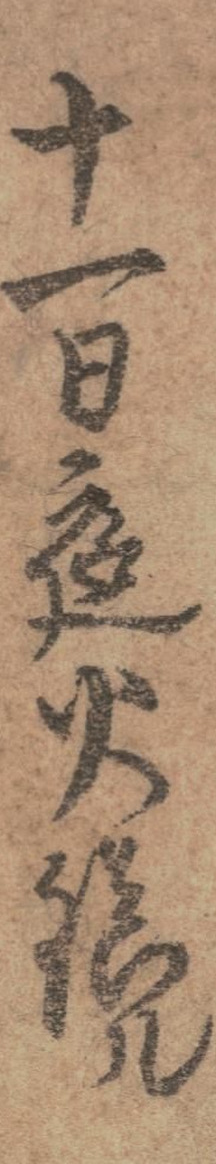十一日夜火鎮る
